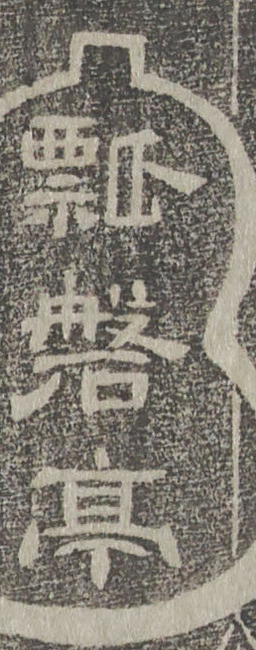瓢磐亭
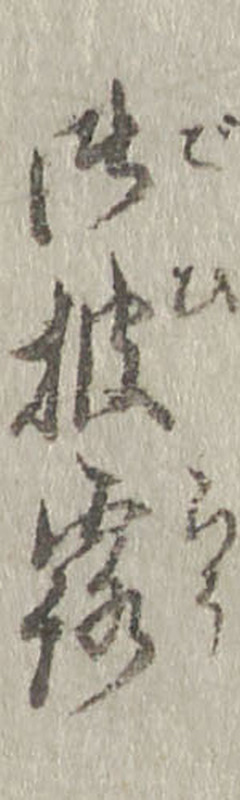御披露
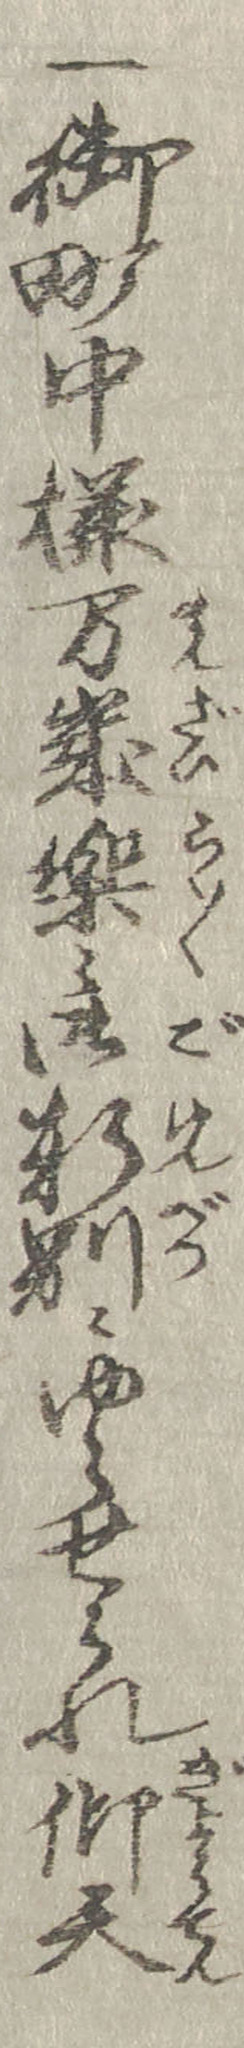一御町中様万歳楽々御軒別にゆらせられ仰天
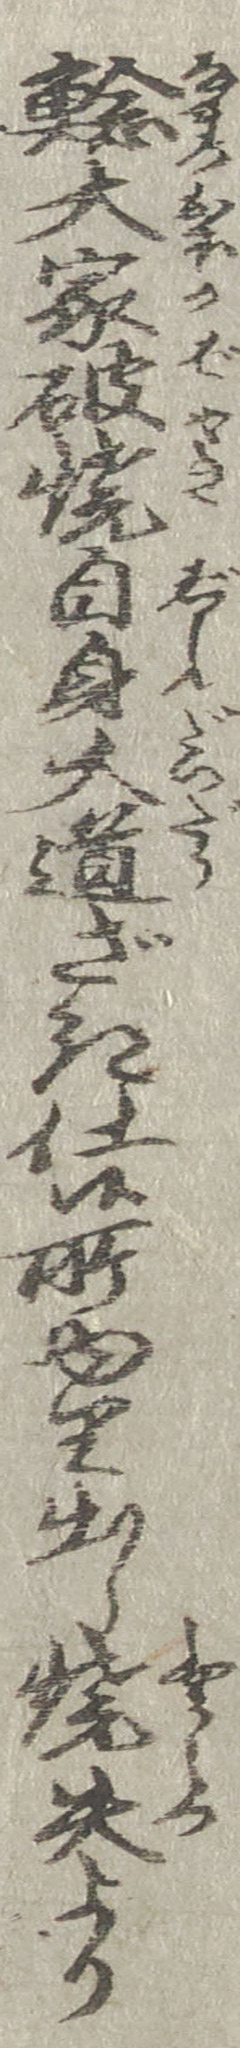鯰大家破焼自身大道ざき仕候所ゆり出し焼失より
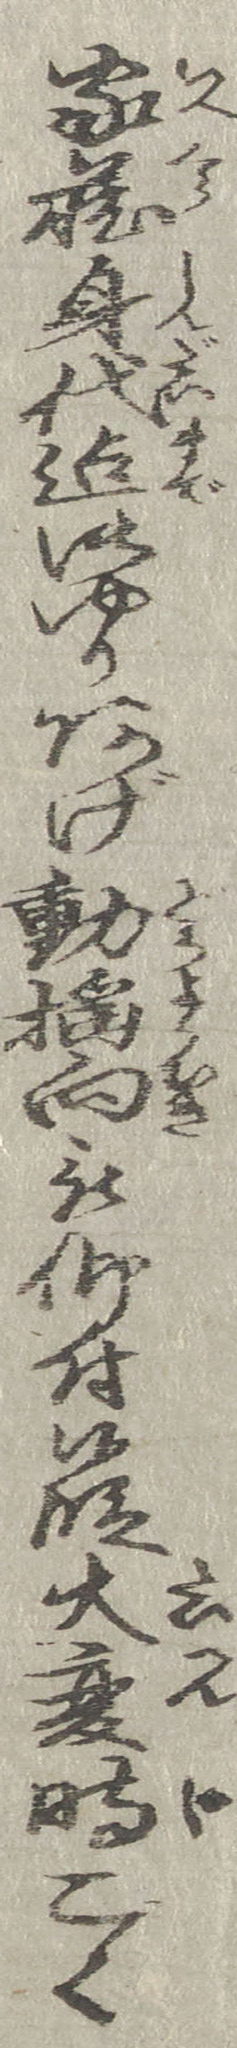家蔵身代迄御ゆりあげ動揺向被仰付候段大変時こく
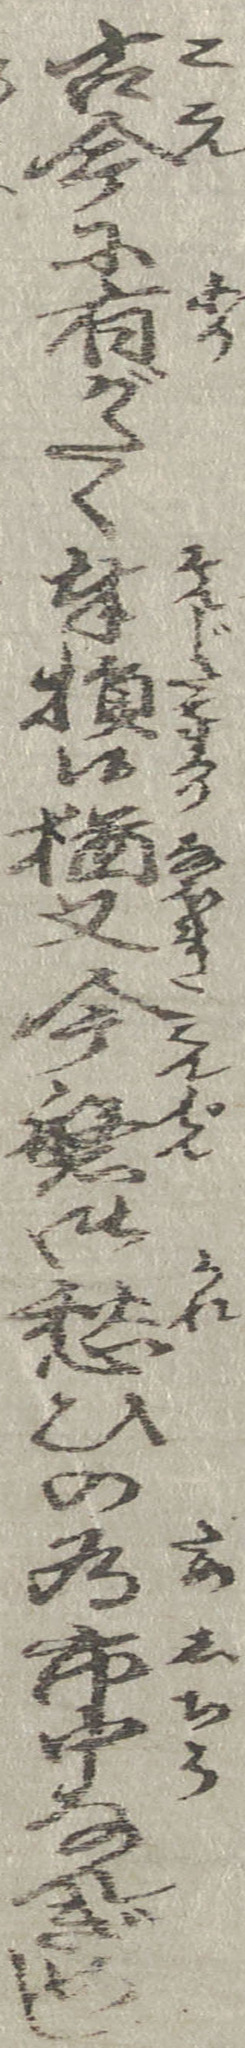古今に有がたく奉損候猶又今磐御愁ひの為市中なんぎめし
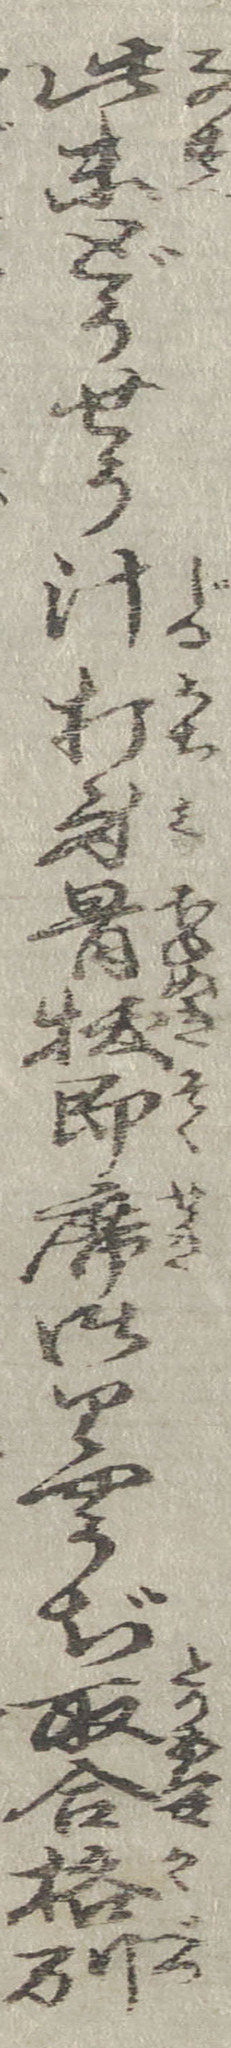此末どうせう汁打身骨抜即席御りやうぢ取合格別
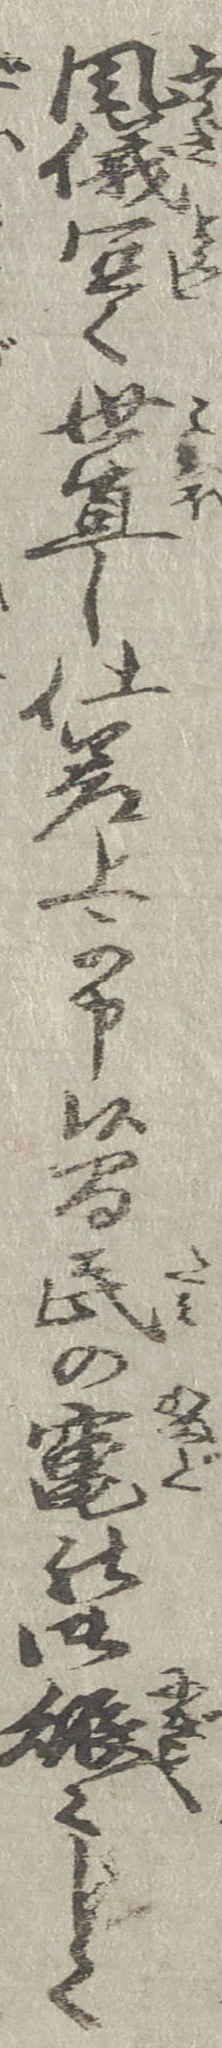風儀宜く世直し仕差上可申候間民の竈の御賑々しく
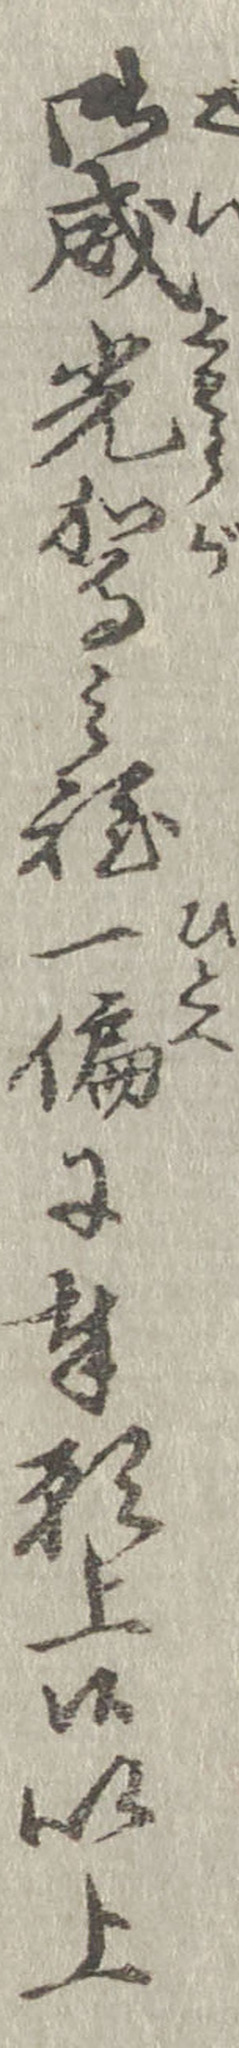御威光駕之程一偏に奉願上候以上
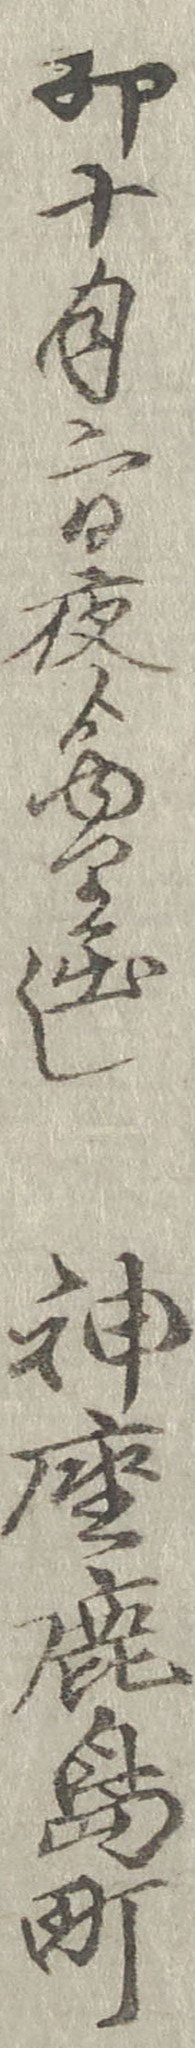卯十月二日夜ゟゆり出し神座鹿島町
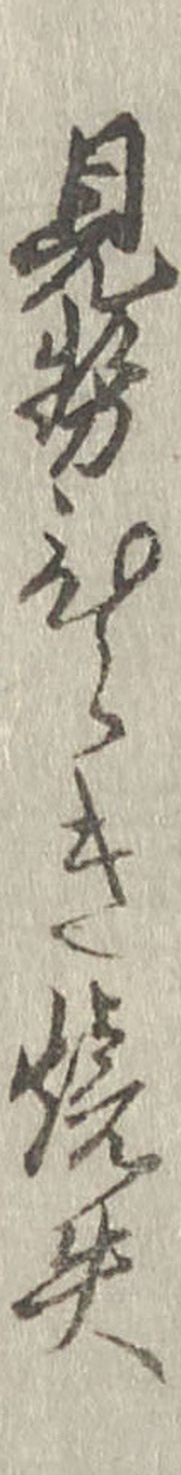見勢ひらき焼失
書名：打身骨抜即席御りやう治
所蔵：東京大学総合図書館 General Library in the University of Tokyo, JAPAN
